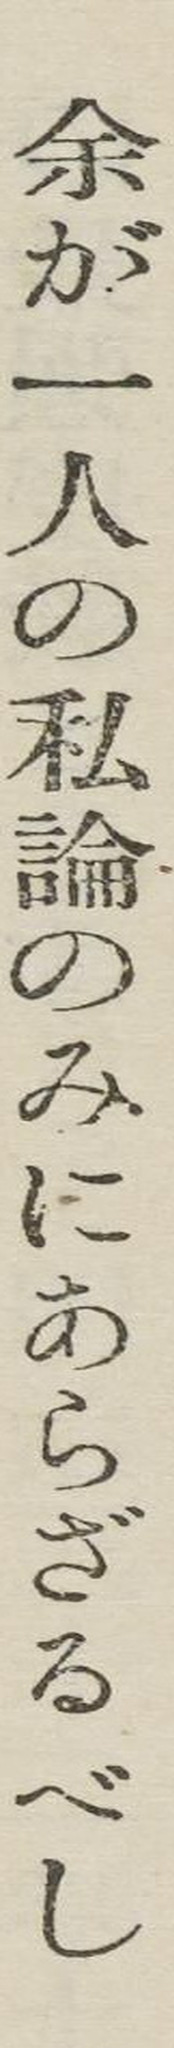余が一人の私論のみにあらざるべし
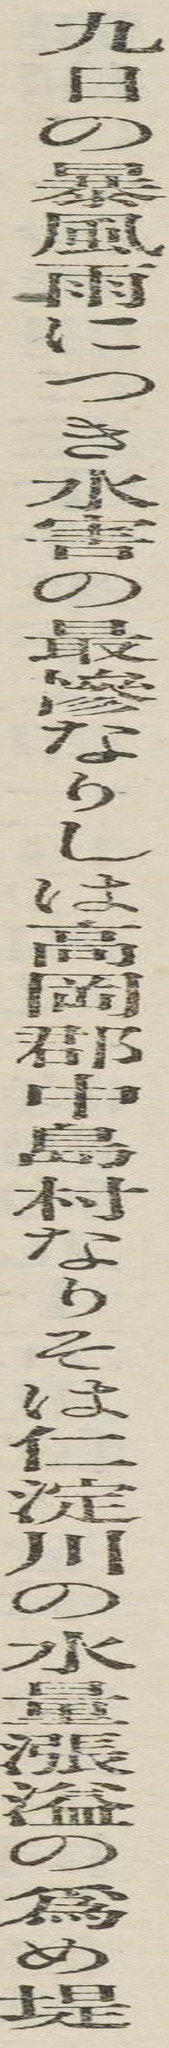九日の暴風雨につき水害の最惨なりしは高岡郡中島村なりそはニ淀川の水量漲溢の為め堤
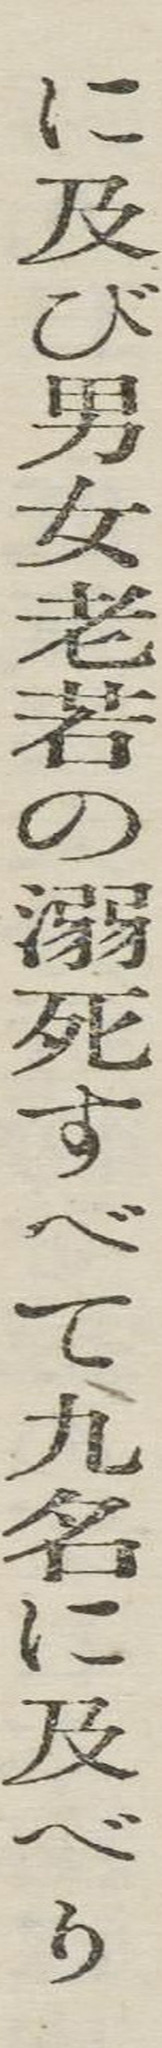に及び男女老若の溺死すべて九名に及べり
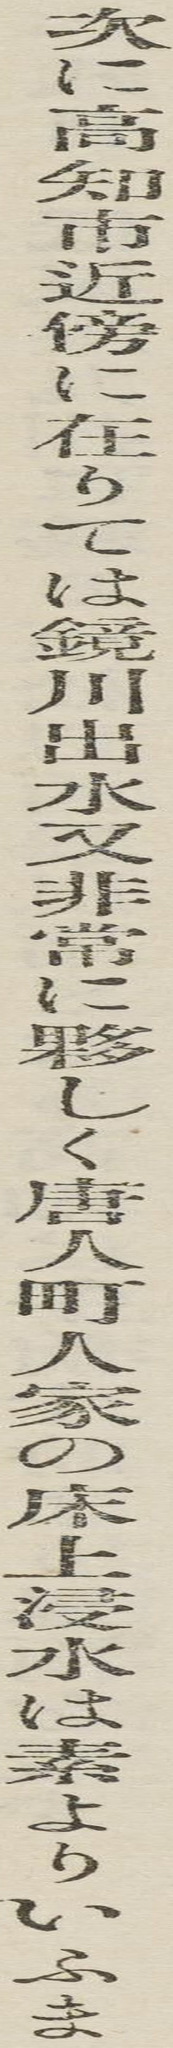次に高知市近傍に在りては鏡川出水非常に夥しく唐人町人家の床上浸水は素よりいふま
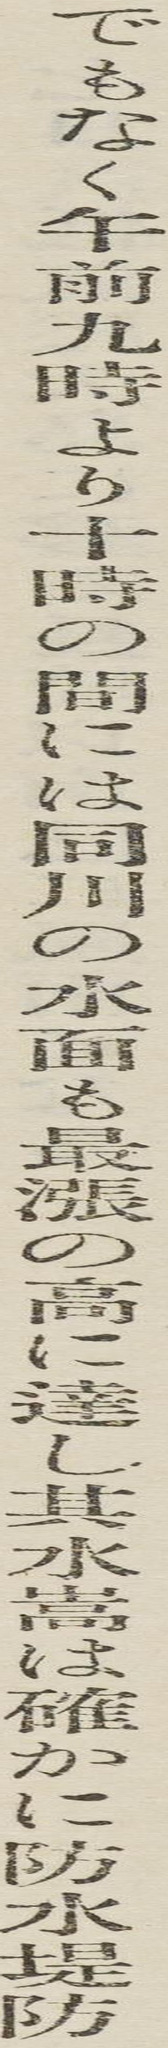でもなく午前九時より十時の間には同川の水面も最漲の高に達し其水嵩は確かに防水堤防
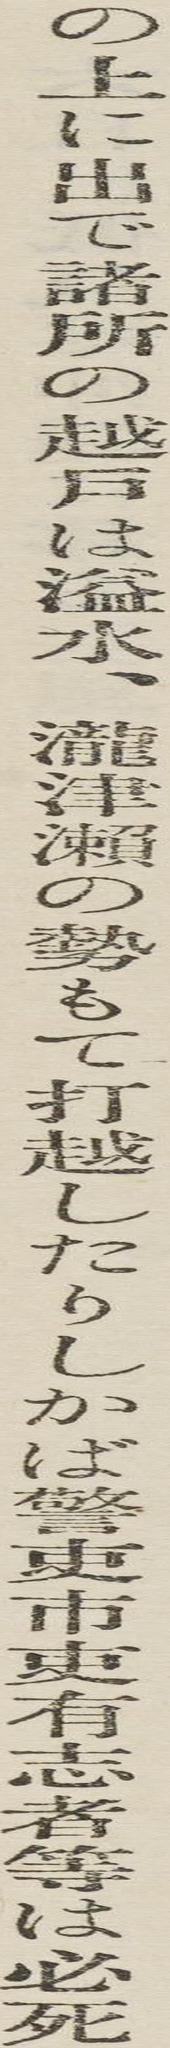の上に出で諸所の越戸は溢水、瀧津瀬の勢もて打越したりしかば警吏市吏有志者等は必死
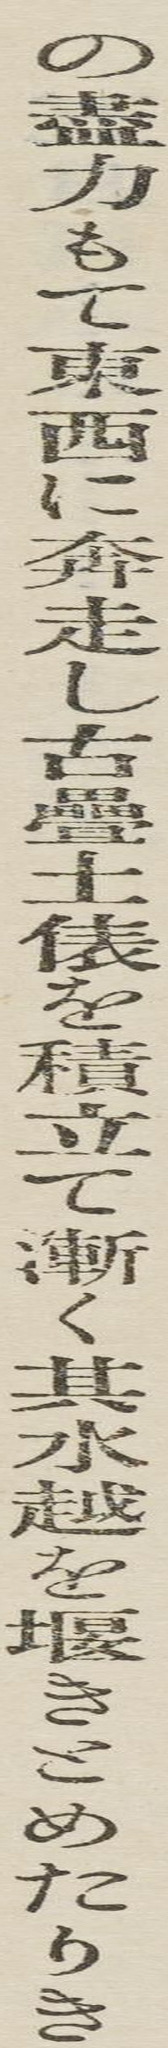の尽力もて東西に奔走し古畳土俵を積立て漸く其水越を堰きとめたりき
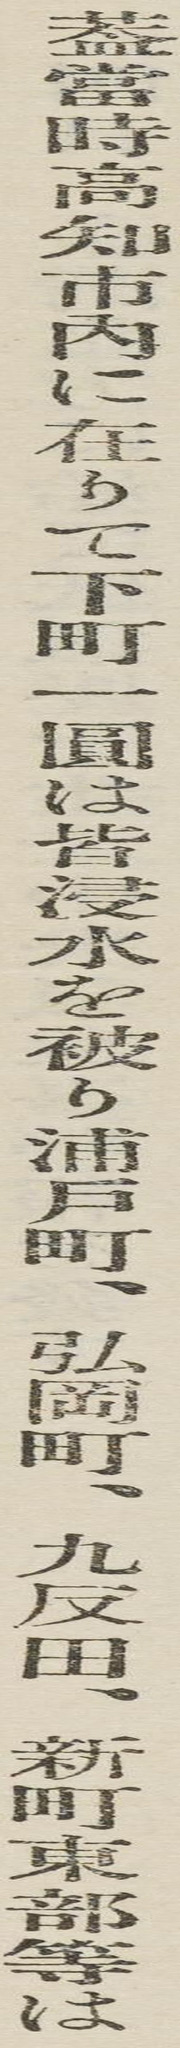蓋当時高知市内に在りて下町一円は皆浸水を被り浦戸町、弘岡町、九反田、新町東部等は
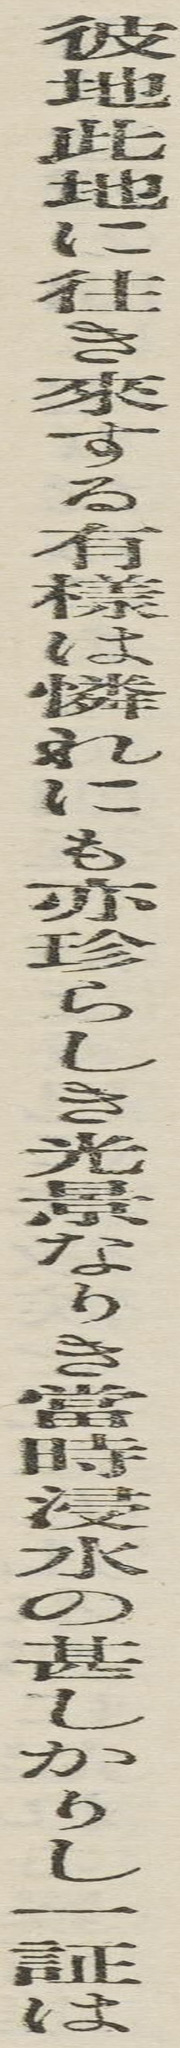彼地此地に往き来する有様は憐れにも亦珍らしき光景なりき当時浸水の甚しかりし一証は
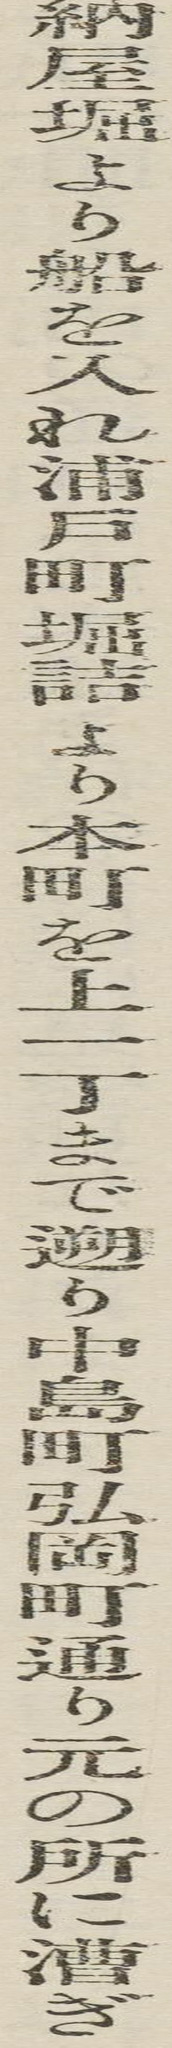納屋堀より船を入れ浦戸町堀詰より本町を上一丁まで遡り中島町弘岡町通り元の所に漕ぎ
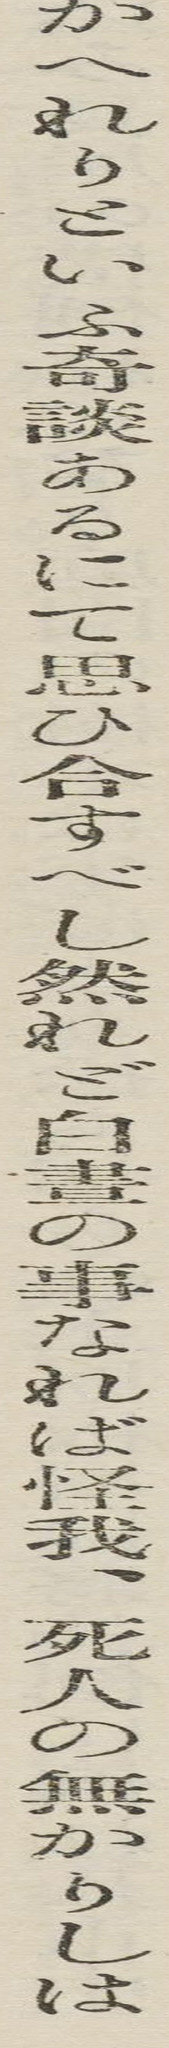かへれりといふ奇談あるにて思ひ合すべし然れど白昼の事なれば怪我、死人の無かりしは
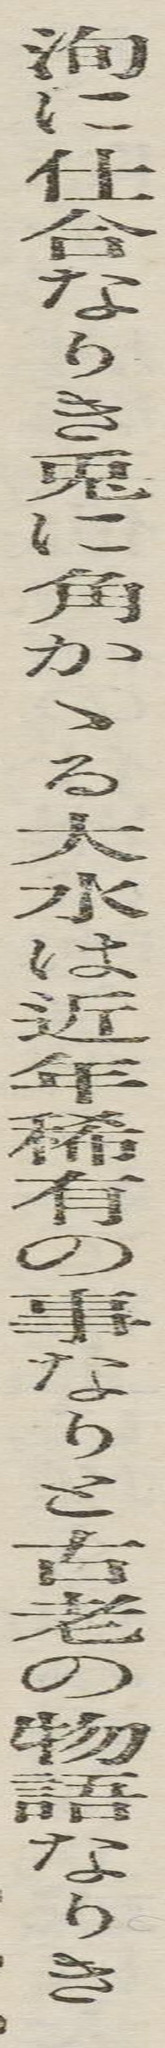洵に仕合なりき兎に角かゝる大水は近年稀有の事なりきと古老の物語なりき
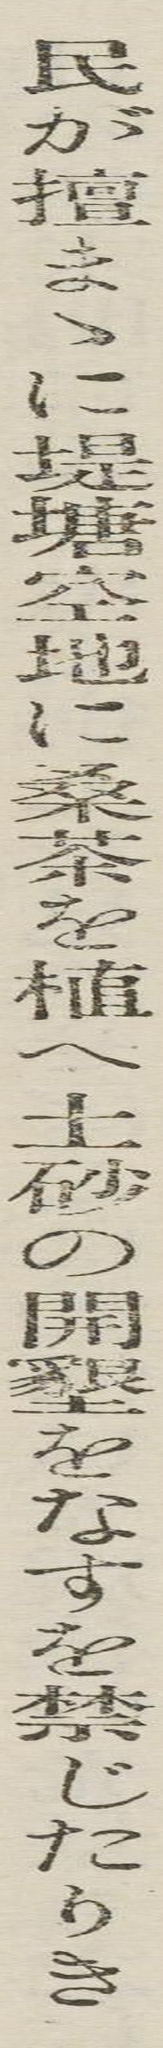民が擅まゝに堤塘空地に桑茶を植へ土砂の開墾をなすを禁じたりき
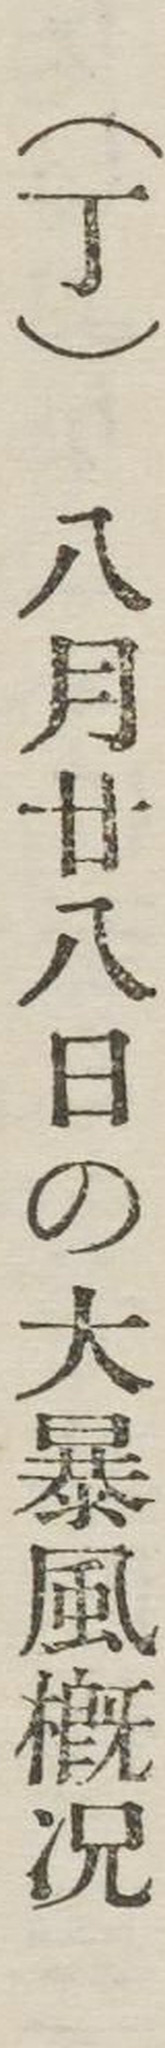八月廿八日の大暴風概況
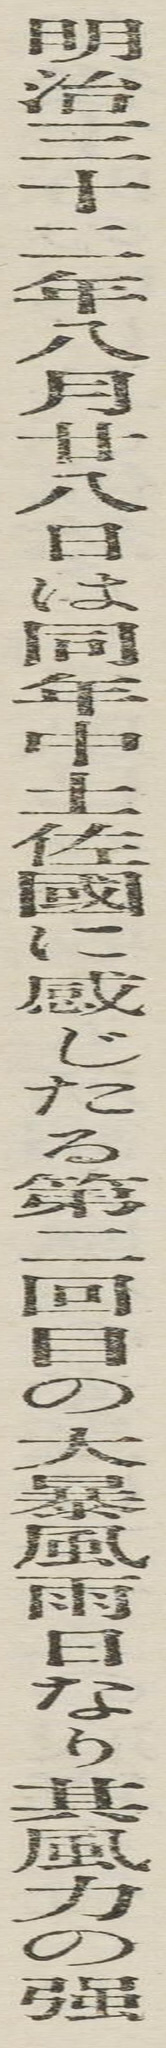明治三十二年八月廿八日は同年中土佐国に感じたる第二回目の大暴風雨日なり其風力の強
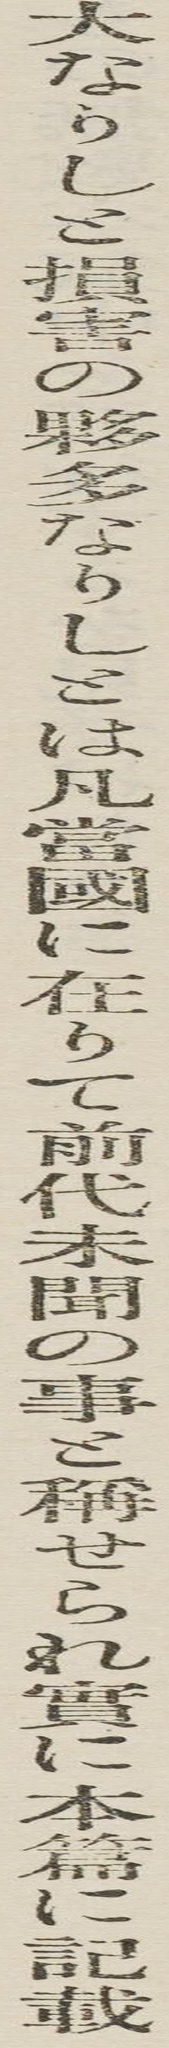大なりしと損害の夥多なりしとは凡当国に在りて前代未聞の事と称せられ実に本篇に記載
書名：土佐古今ノ地震
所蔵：東京大学地震研究所図書室 Earthquake Research Institute Library, The University of Tokyo, JAPAN
